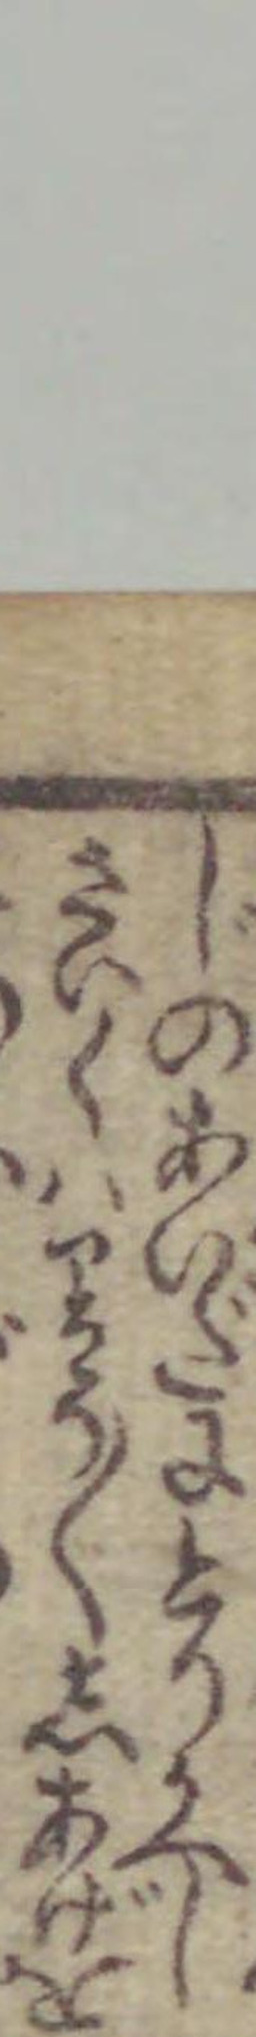さいくはりう〳〵しあげを
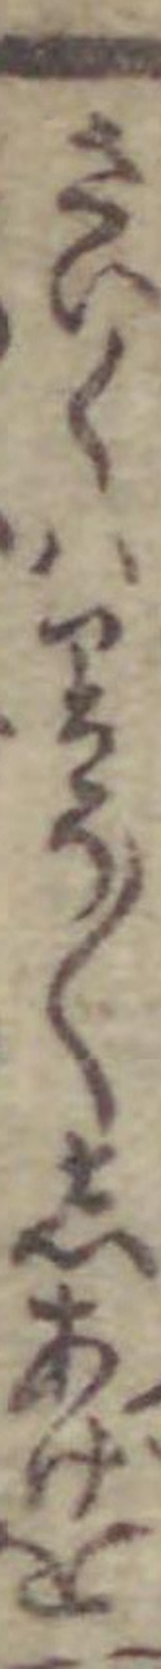さいくはりう〳〵しあげを
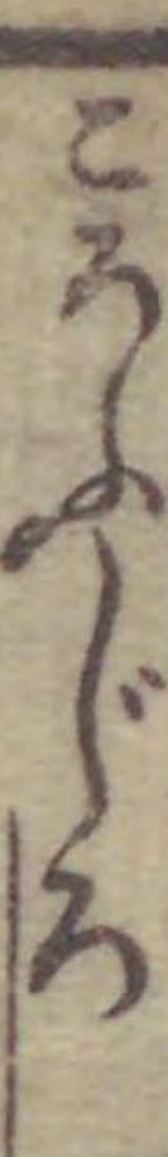ころふじろ
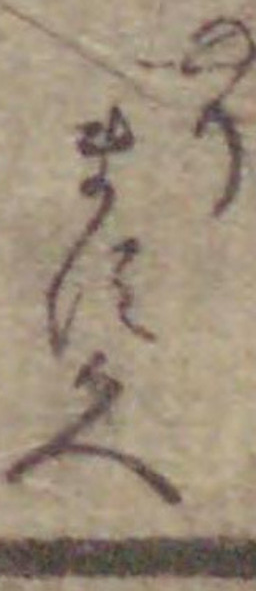ますかへ
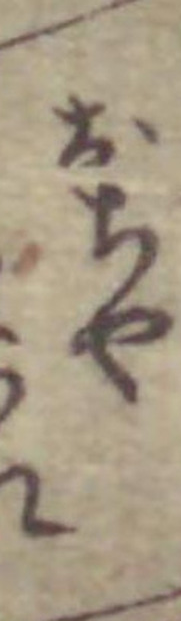おちや
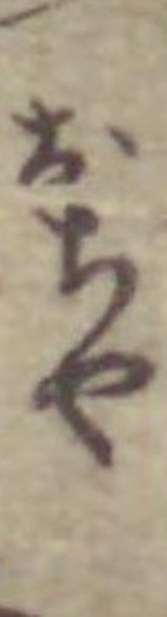おちや
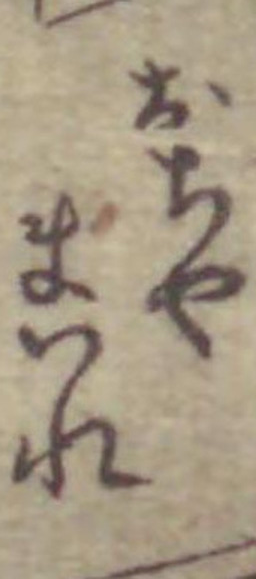まいれ
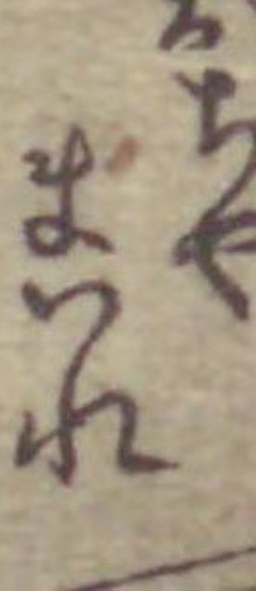まいれ

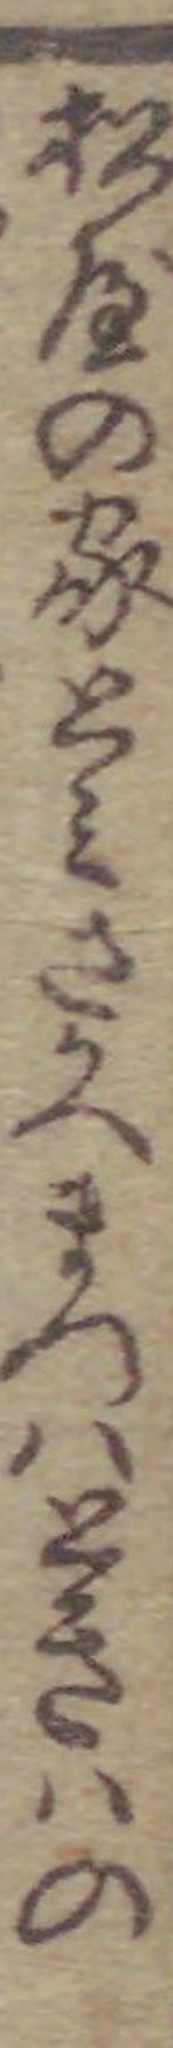松屋の家とみさかへまつはときはの
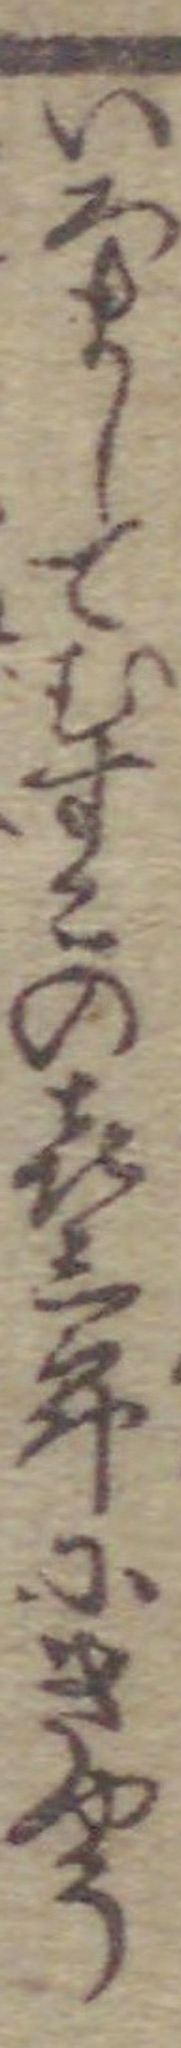いろましてむすこの喜三郎にきやう
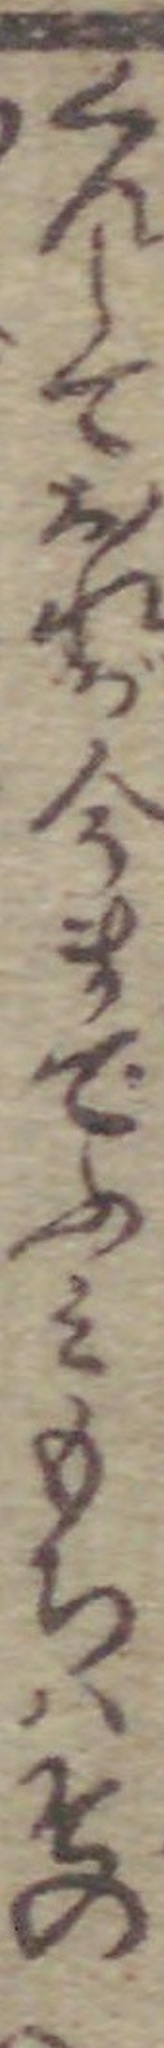くんしておれが今までにみもちはその
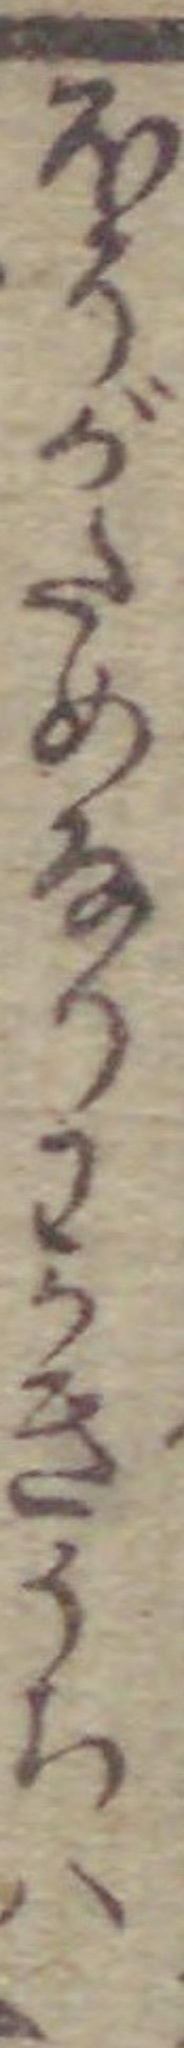ほうがためなりわかきうちは
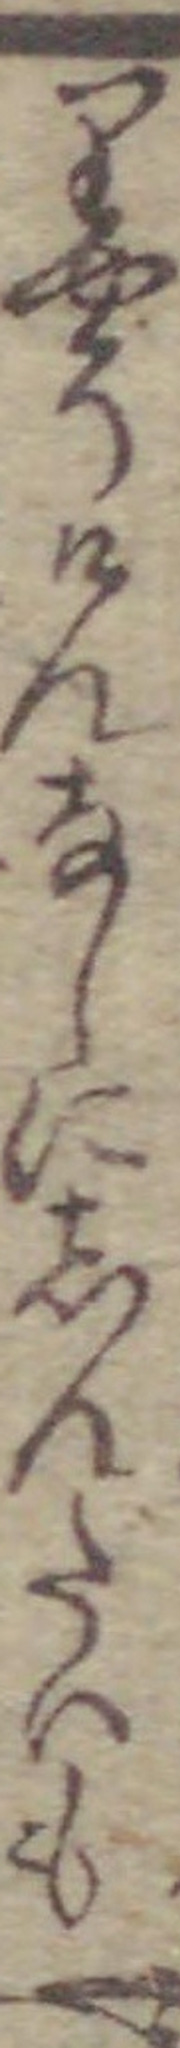りやうけんなしにしんだいも
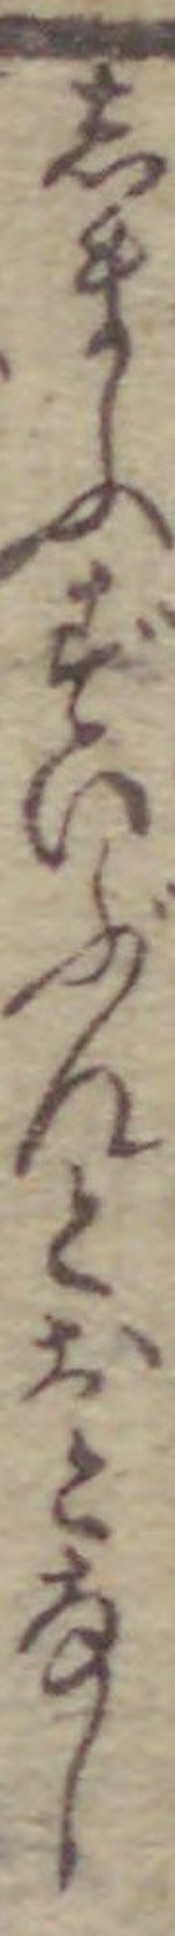しまふずいぶんとおとなし
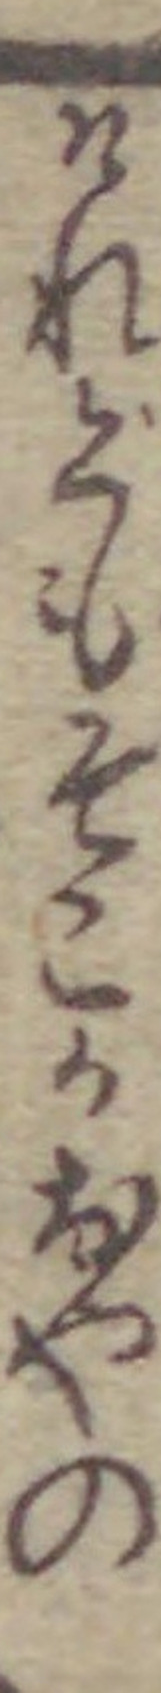けれどもそこかおやの
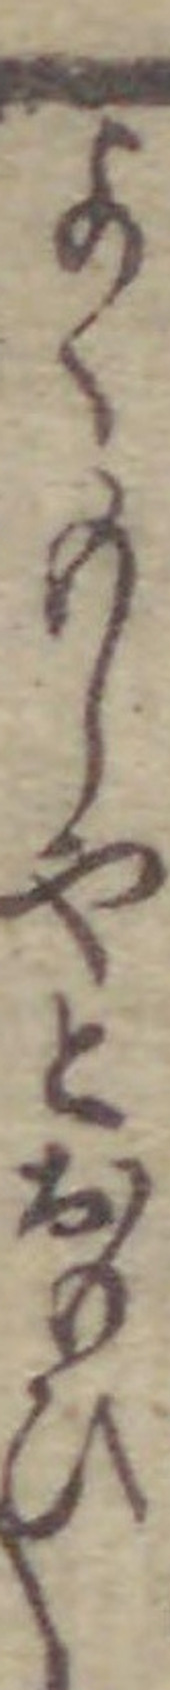よくもしやとおもひ
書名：親父布子鳶握 3巻
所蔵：国立国会図書館 National Diet Library, JAPAN
